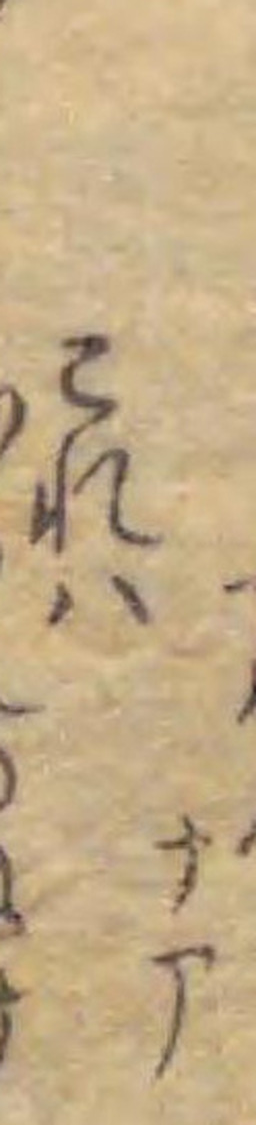これは
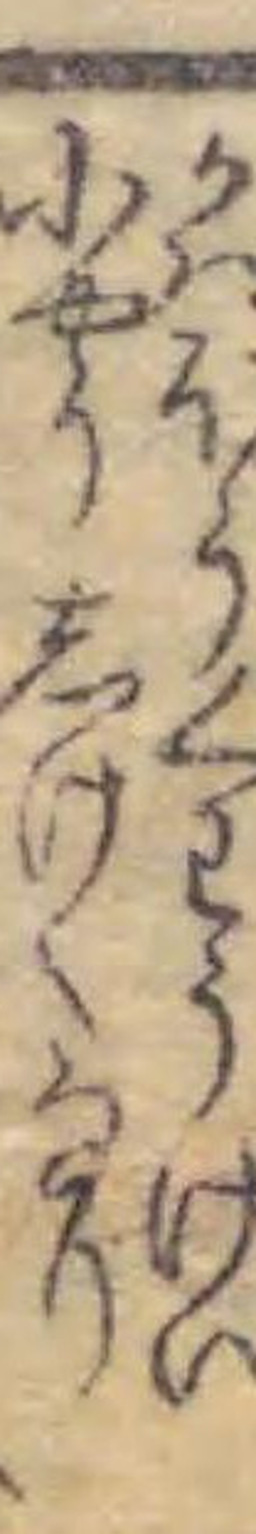小やうしけくなり
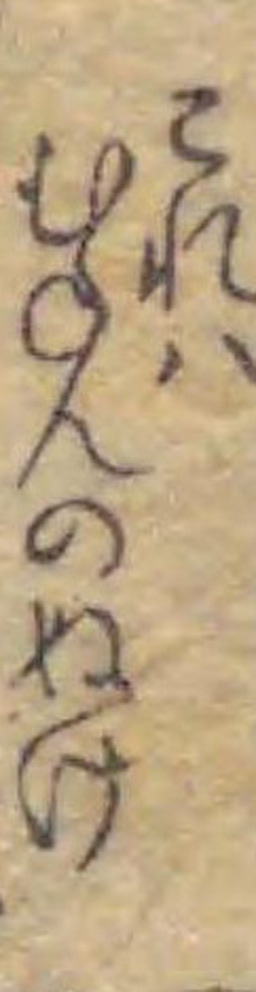むねんのぬけ
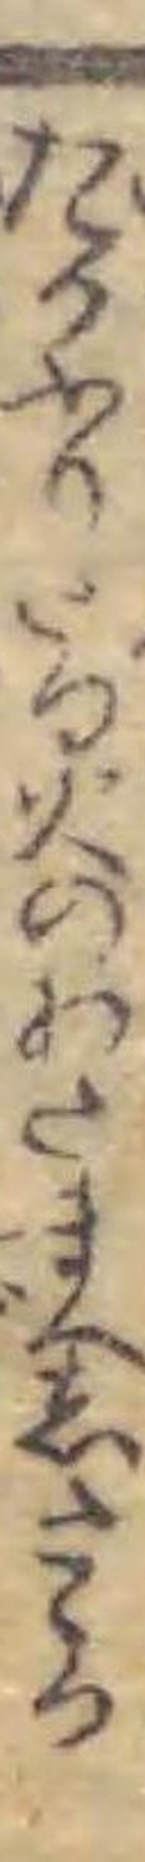たかふりたる火のあたまへしたゝか
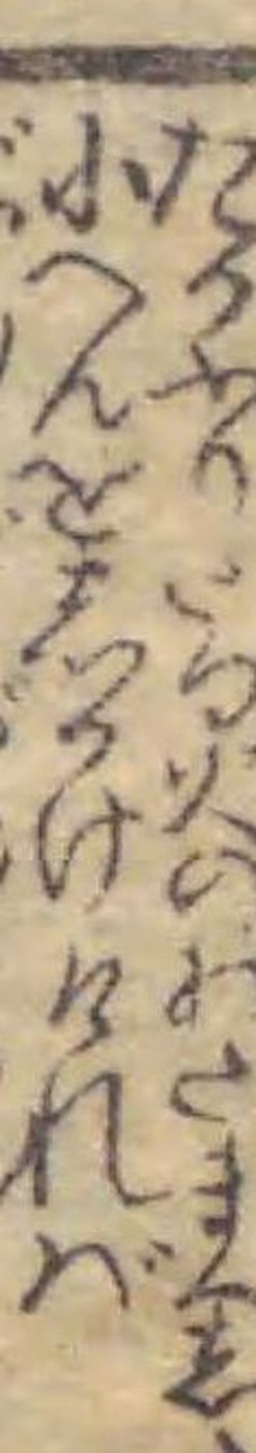小へんをしかけければ
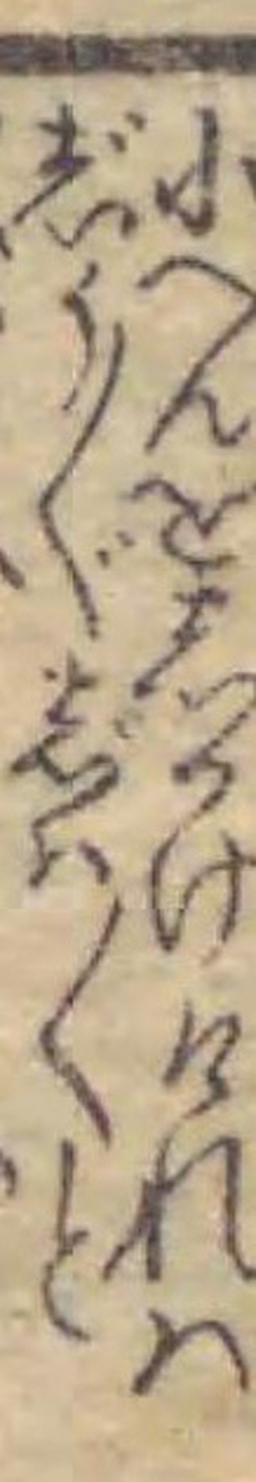じう〴〵じは〳〵と
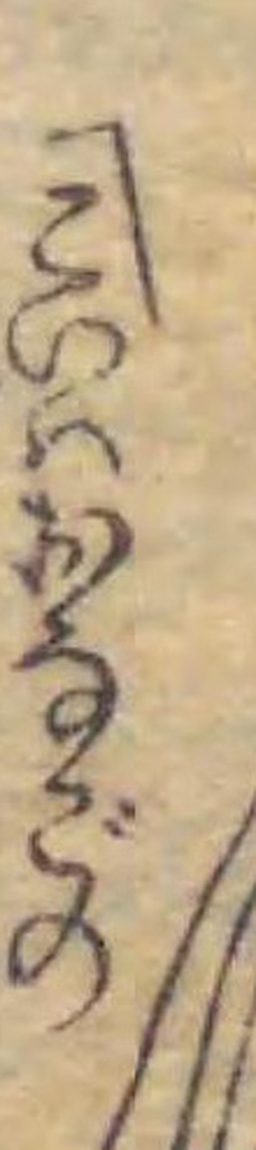〽こいはおなごの
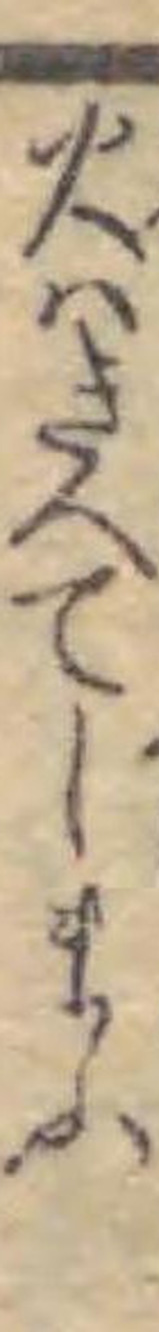火はきへてしまふ
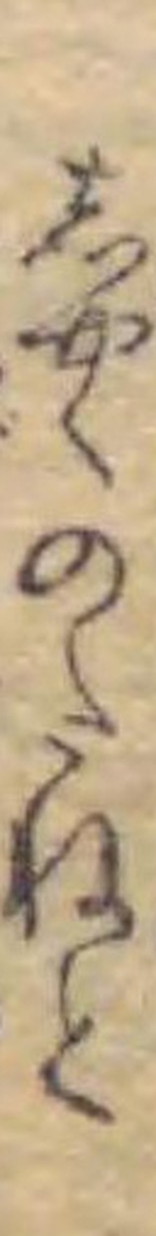しやくのたねと
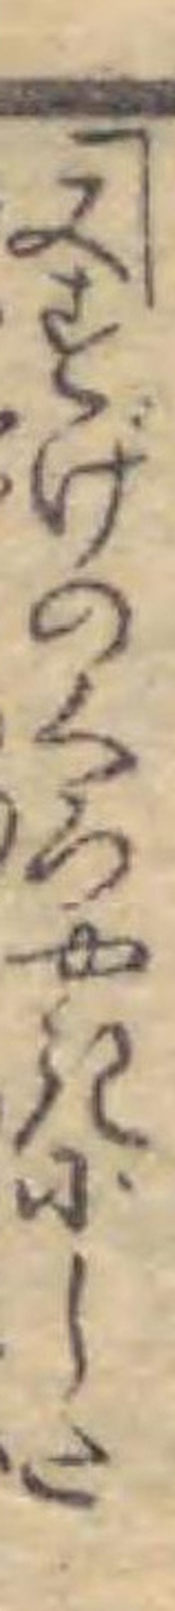〽又すげのくろやきにした
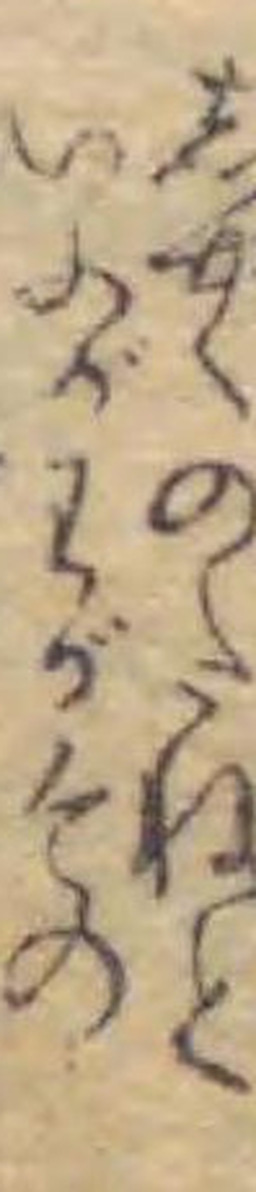いふがわがその
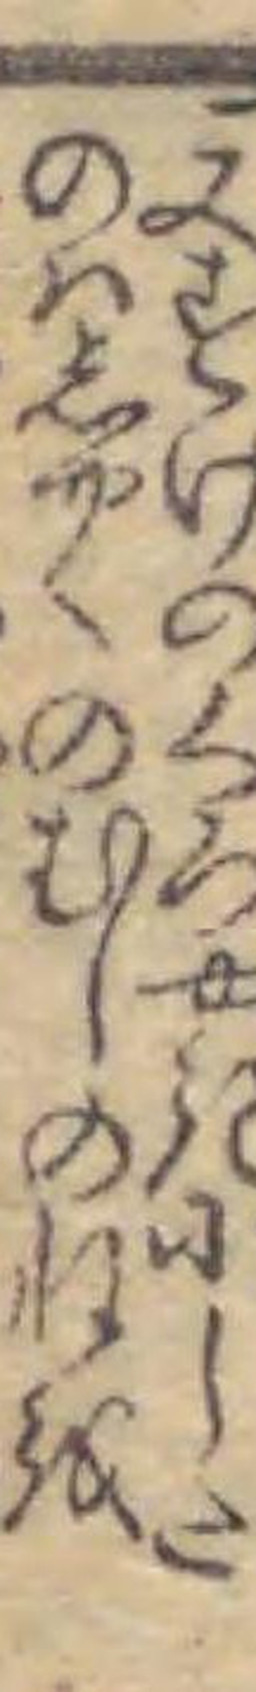のはしやくのむしのねを
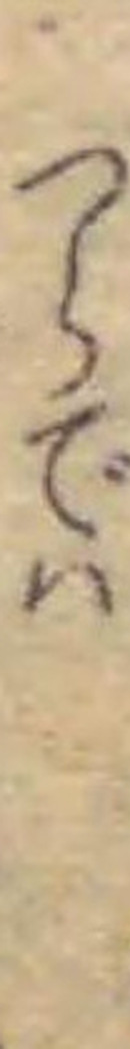つらでは
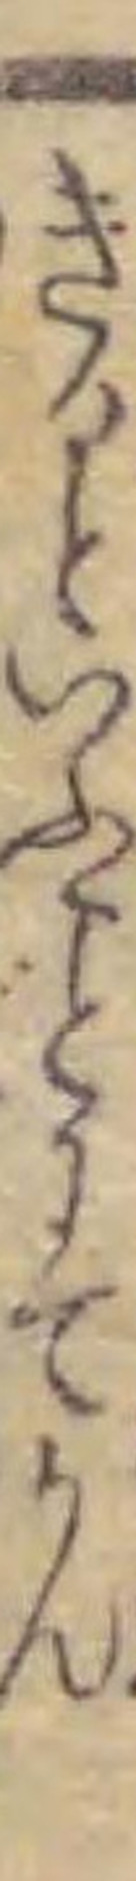きるといふことにてかん
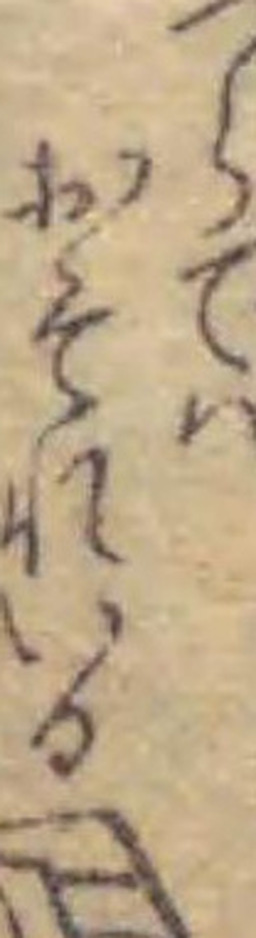おそれいる
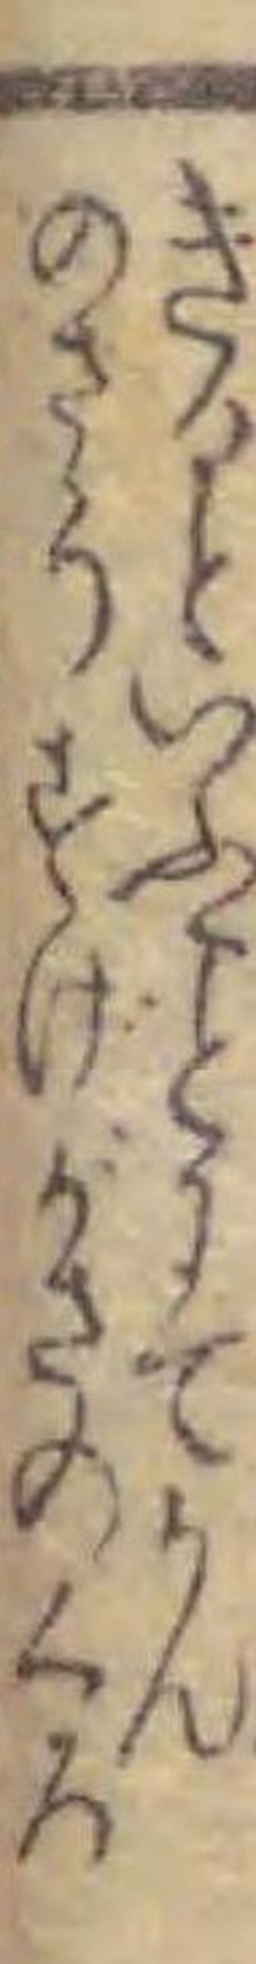のさうすげがさのくろ
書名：十四傾城腹之内 : 3巻
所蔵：国立国会図書館 National Diet Library, JAPAN
